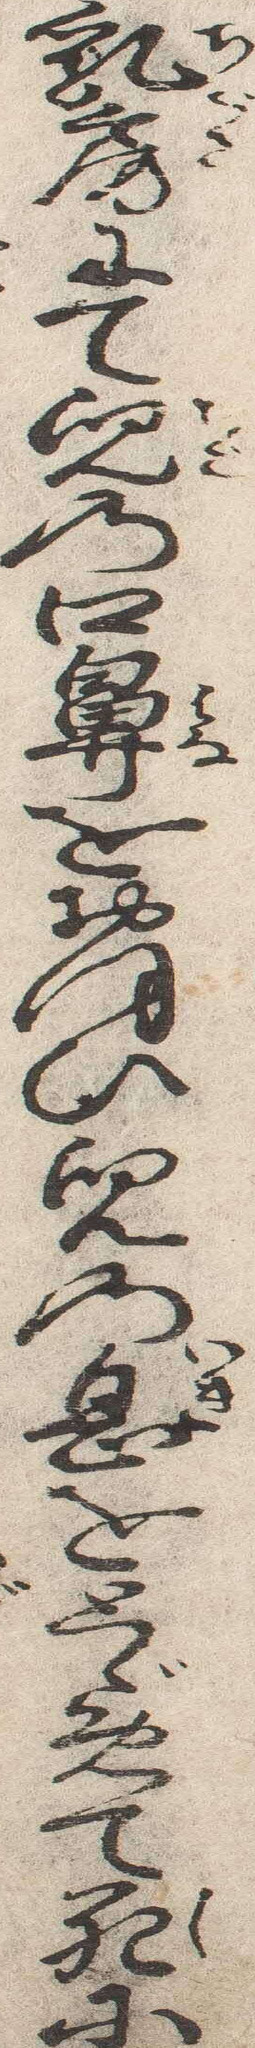乳房にて児の口鼻をおほひ児の息をとゞめて死に
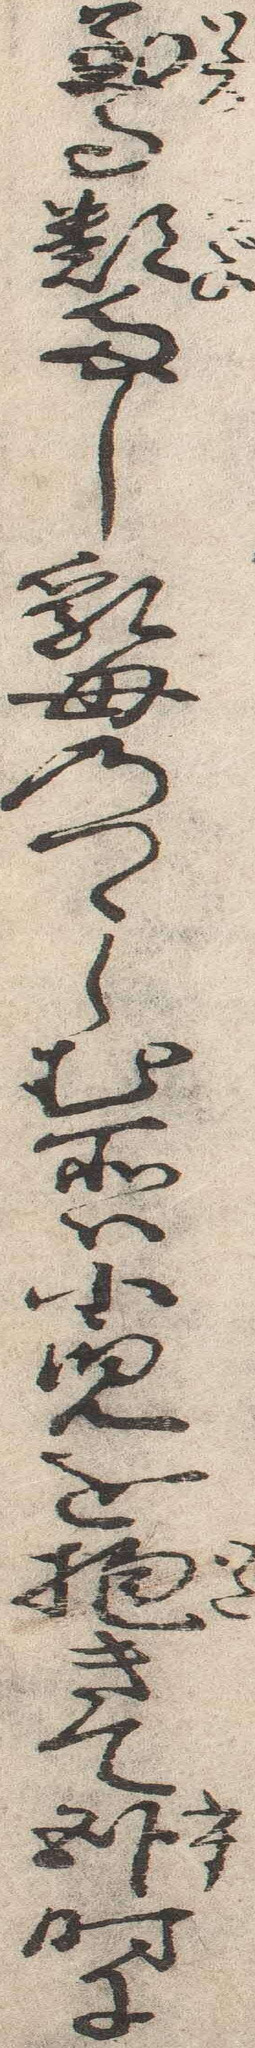至る類多し乳母のつゝしむ所は小児を抱きて臥時に

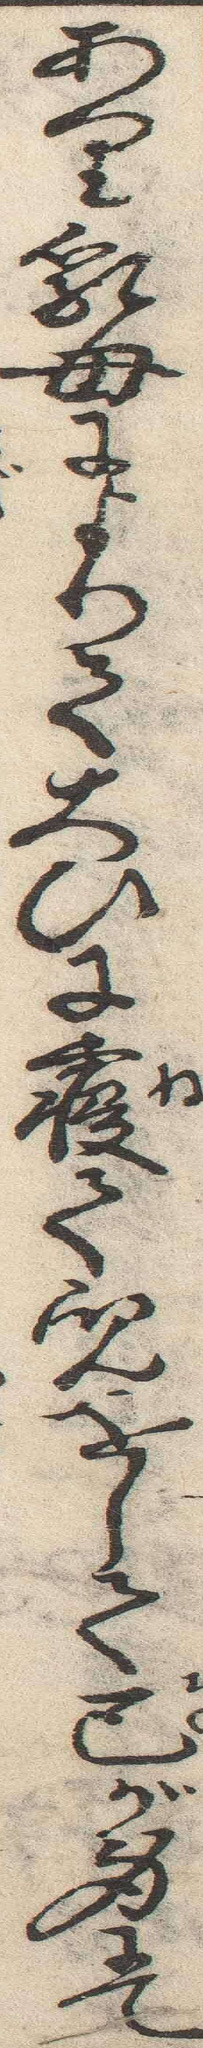あり乳母によりて大ひに寝て児をして己が身にて
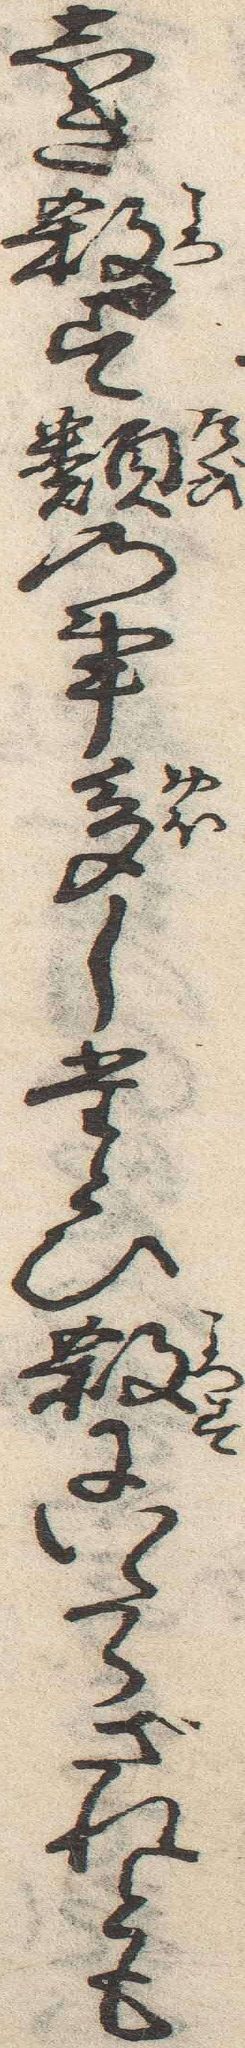しき殺す類の事多したとひ殺にいたらざれとも
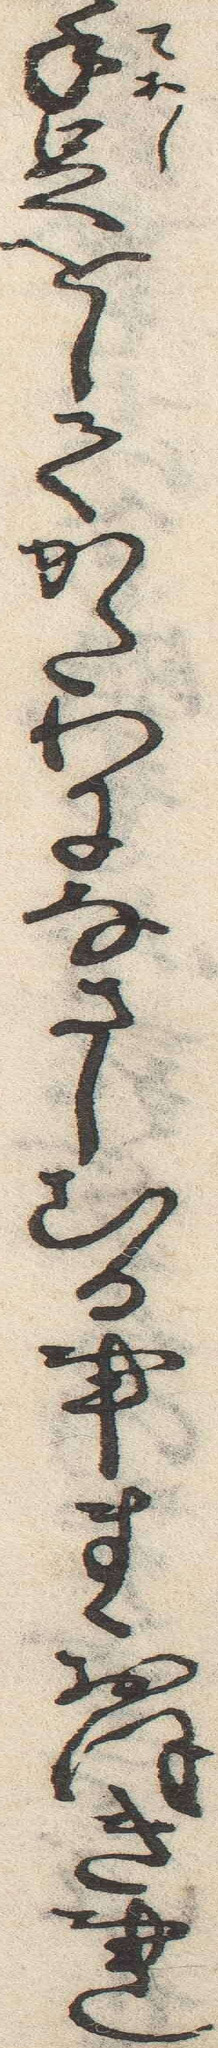手足をしてかたわになさしむる事まゝおほき事也
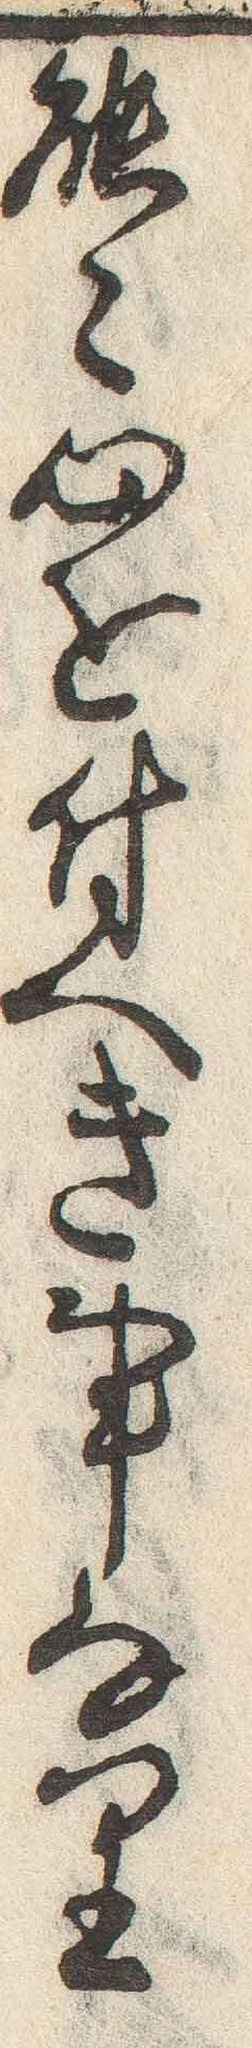能々心を付へき事なり
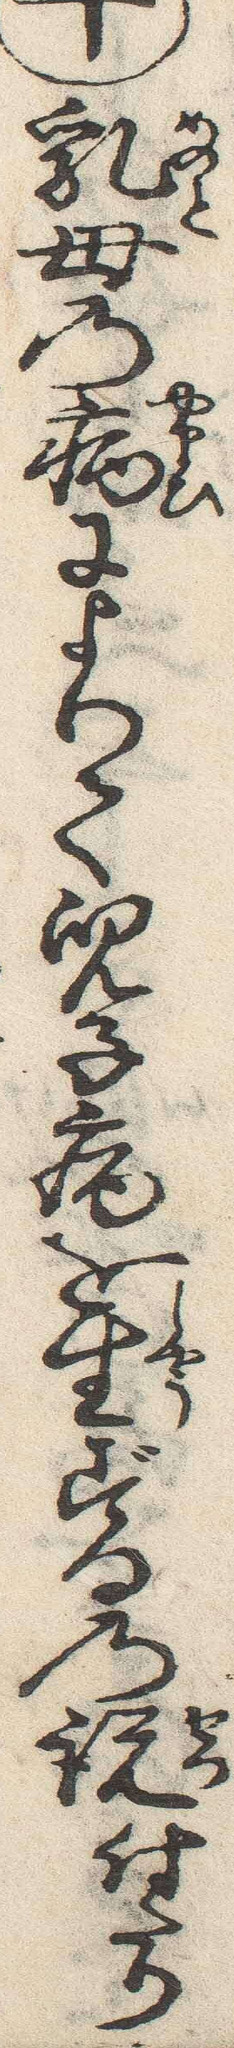㊉乳母の病によりて児子病を生ずるの説付たり
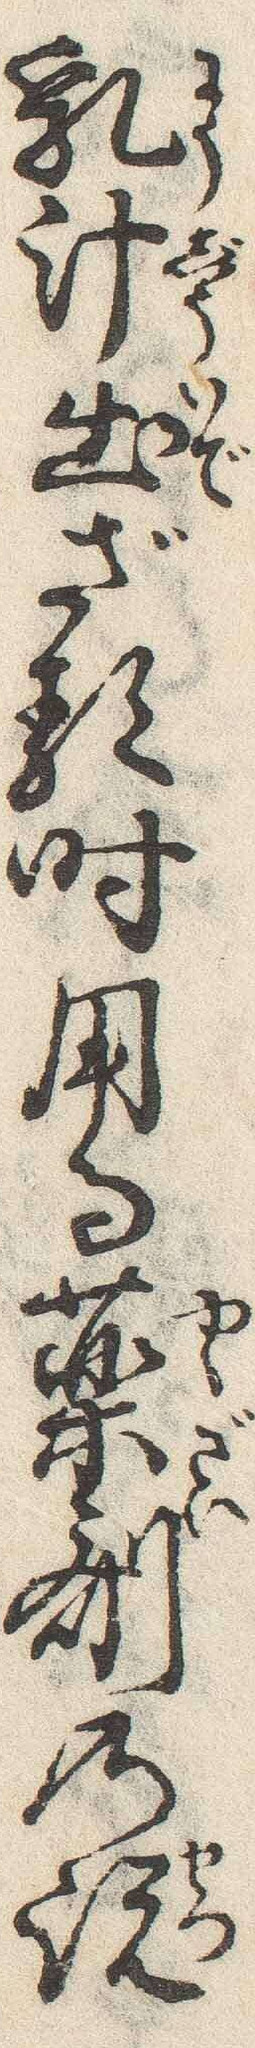乳汁出ざる時用る薬剤の説
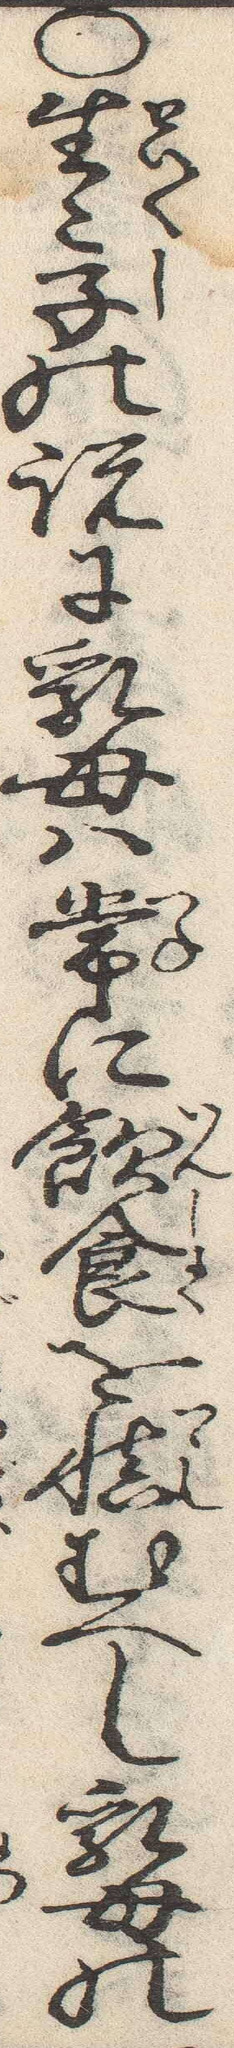◯生々子の説に乳母は常に飲食を慎むへし乳母の
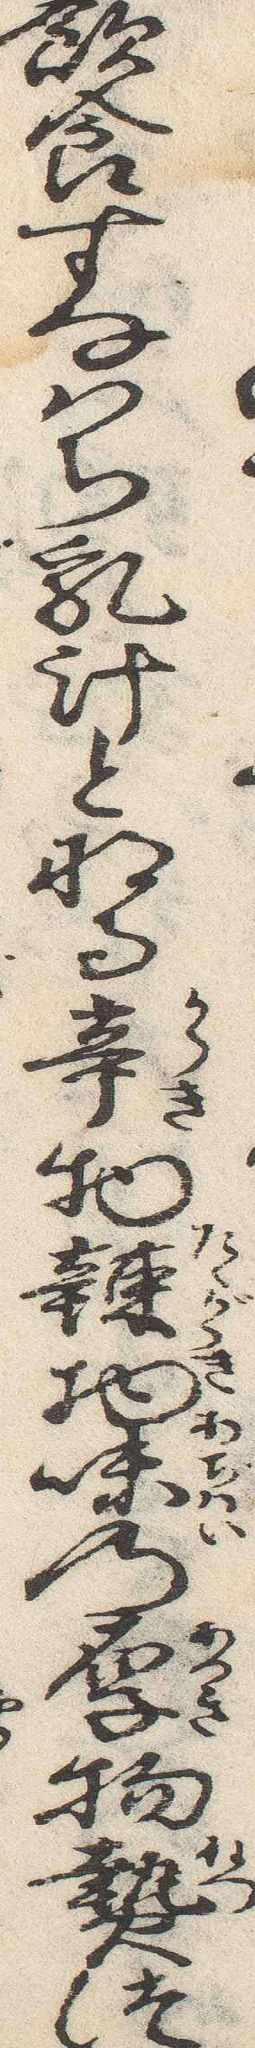飲食すなはち乳汁となる辛物辣物味の厚物熱つ
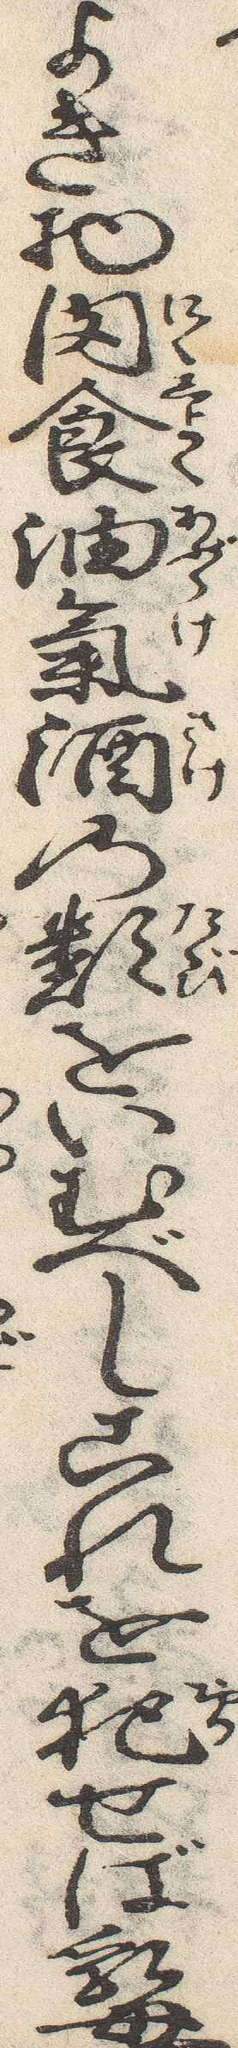よき物肉食油氣酒の類をいむべしこれを犯せば乳母
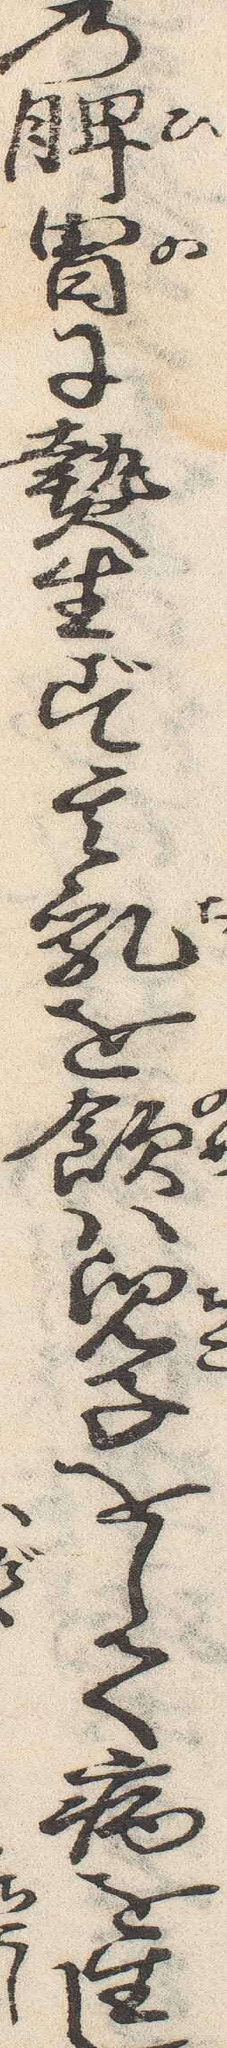の脾胃に熱生ず其乳を飲は児子をして病を生し
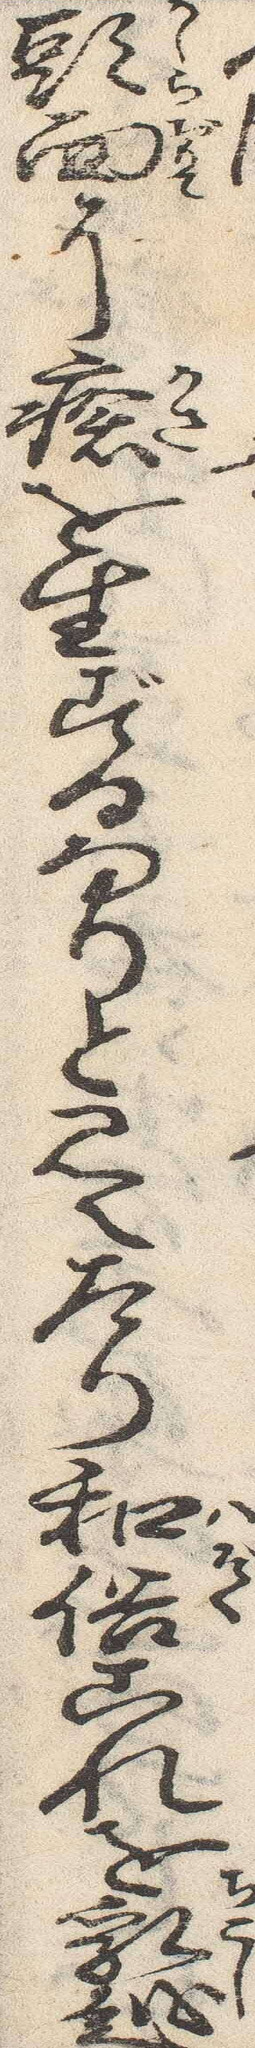頭面に瘡を生ずるなりと見えたり和俗これを乳越
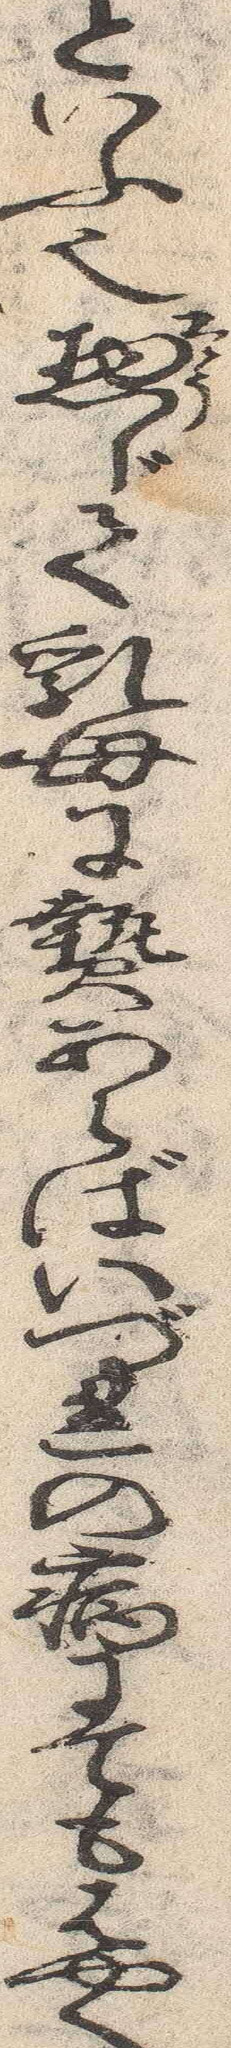といふ也惣じて乳母に熱あらばいづれの病にてもはやく
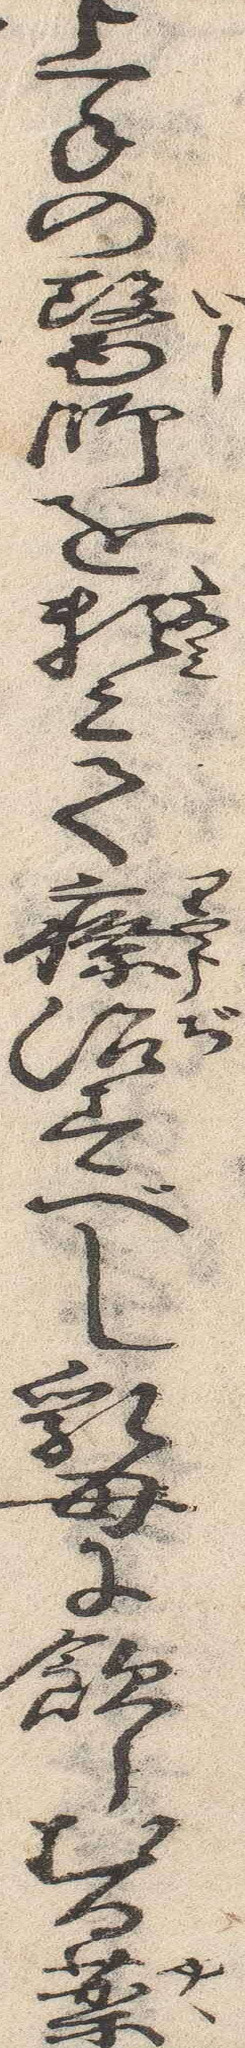上手の醫師を頼て療治すべし乳母に飲しむる薬
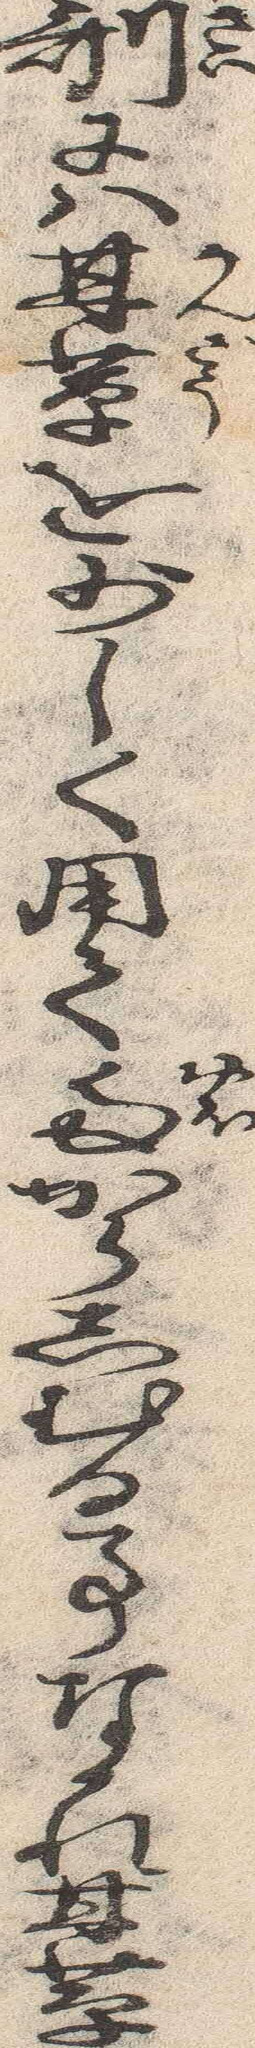剤には甘草を少しく用て多からしむる事なかれ甘草
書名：小児必用養育草
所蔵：東京学芸大学附属図書館 国文学研究資料館
